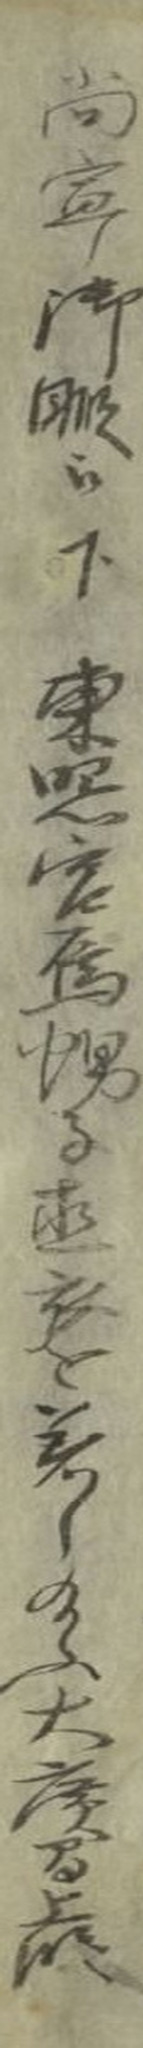尚寧御段被下東照宮烏帽子直衣を着し給ふ大広間上段
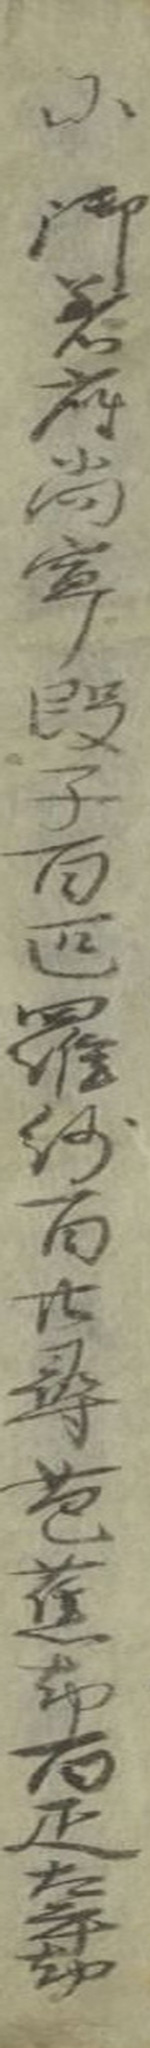に御着座尚寧段子百疋羅紗百廿尋芭蕉布百疋太平布
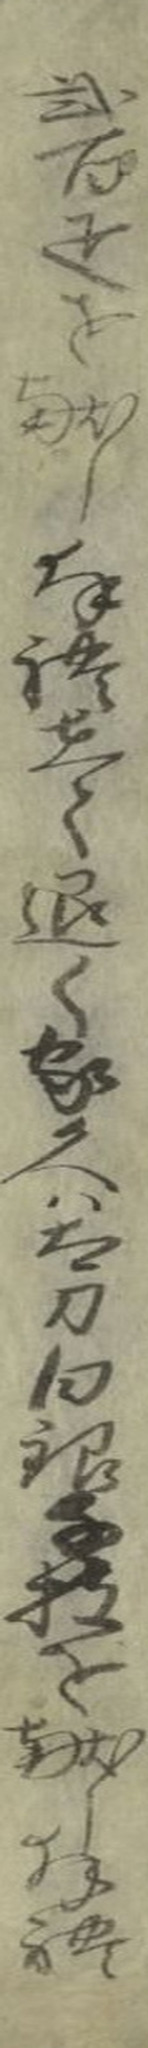二百疋を献し拝礼在て退く家久は太刀白銀千枚を献し拝礼
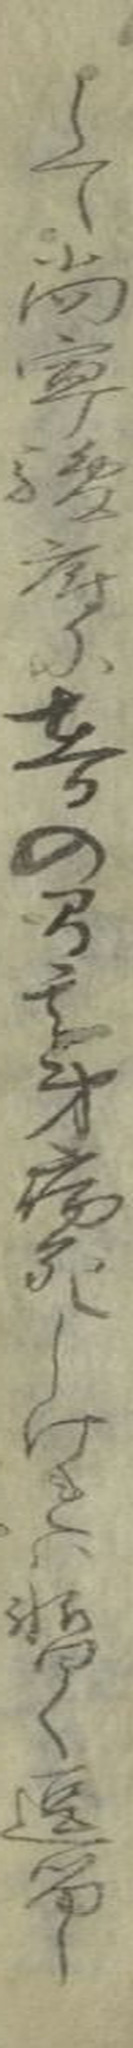して尚寧駿府に在るの間其弟病死しけれは暫く逗留し
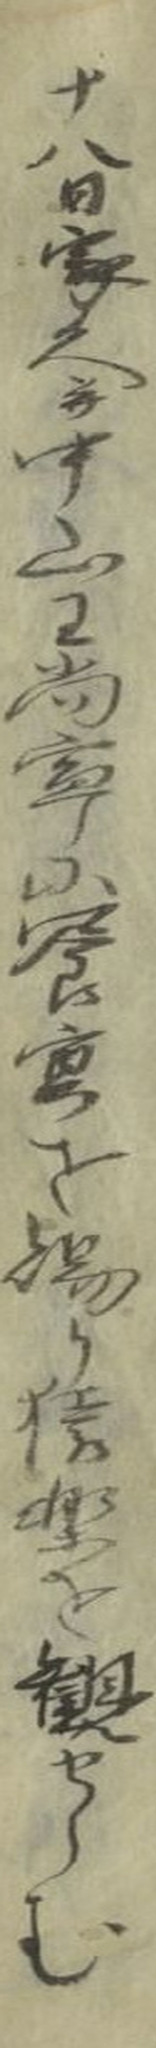十八日家久并中山王尚寧に饗宴を賜り猿楽を観せしむ
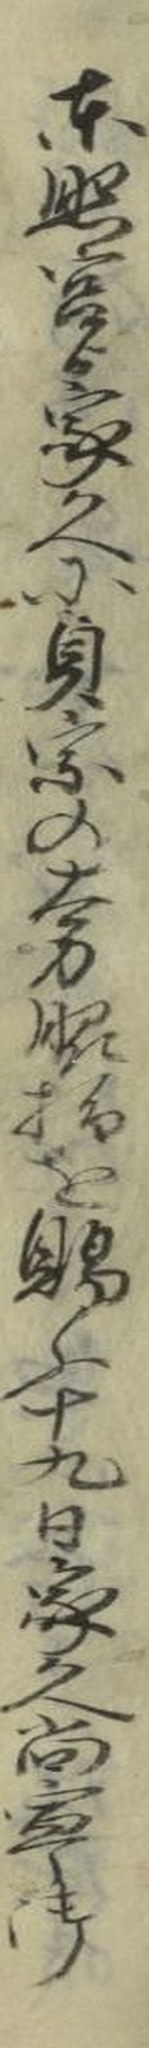東照宮ゟ家久に貞宗の太刀脇指を賜ふ十九日家久尚寧御
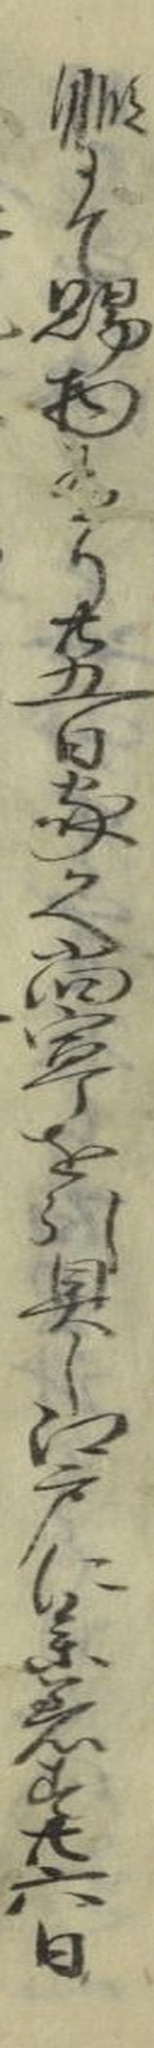暇にて賜物有り廿五日家久尚寧を引具し江戸に参着す廿六日
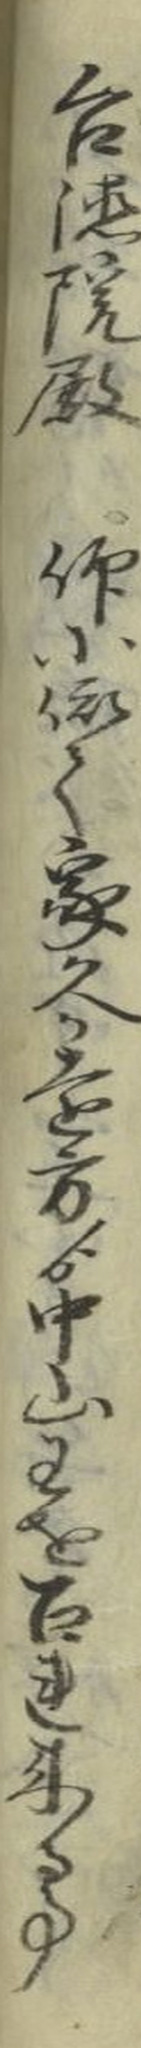台徳院殿仰に依て家久か遠方ゟ中山王を召連来る事
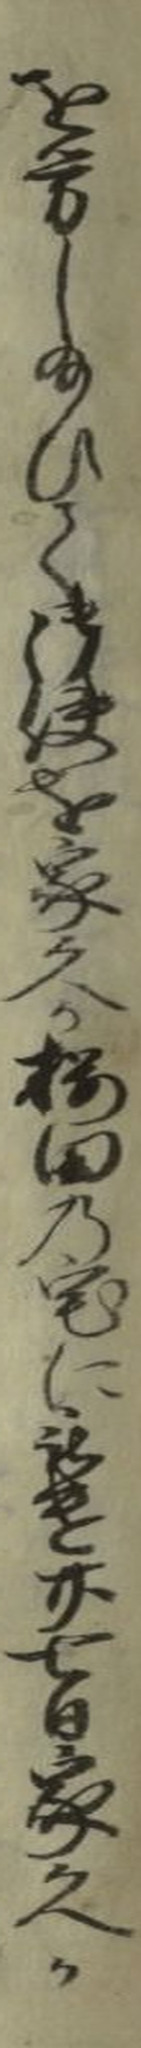を労し給ひて御使を家久か桜田の宅に被遣廿七日家久か
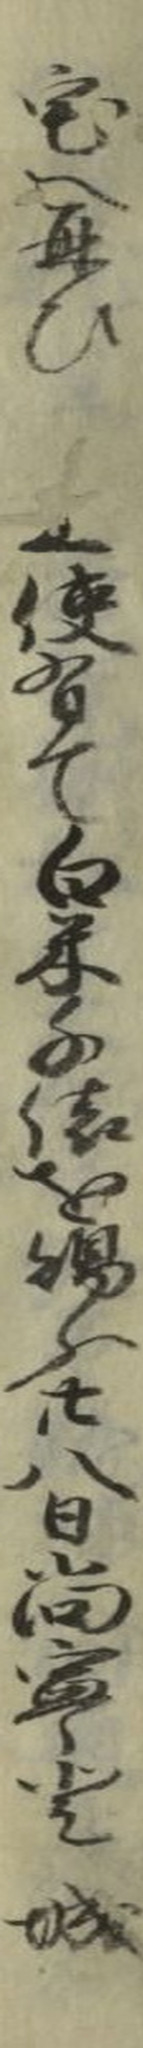宅へ再ひ使有て白米千俵を賜ふ廿八日尚寧登城
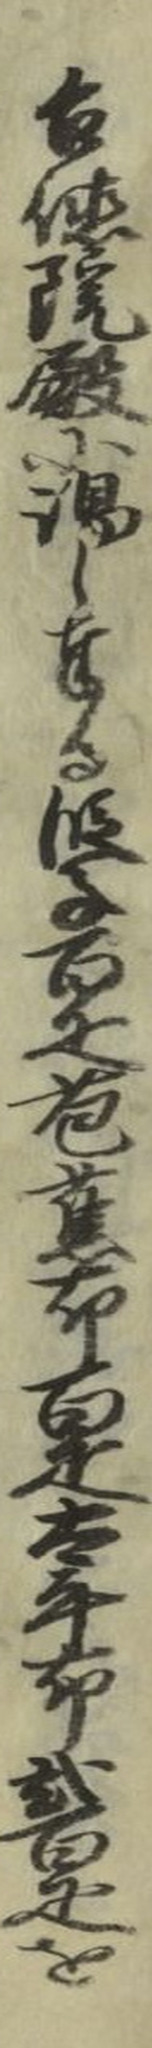台徳院殿に謁し奉る緞子百疋芭蕉布百疋太平布二百疋を
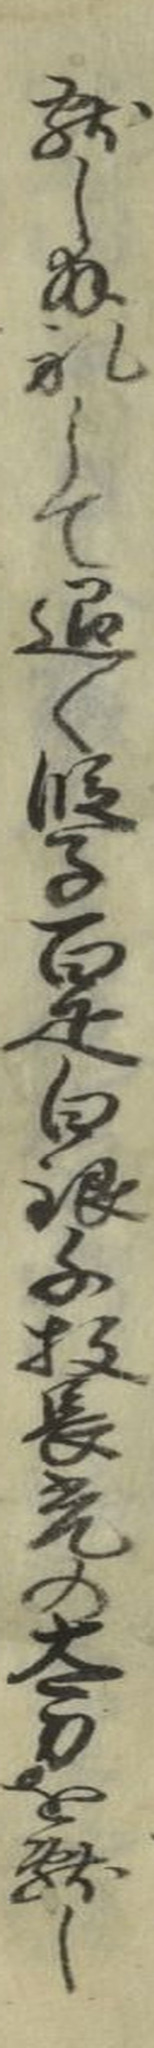献し拝礼して退く緞子百疋白銀千枚長光の太刀を献し
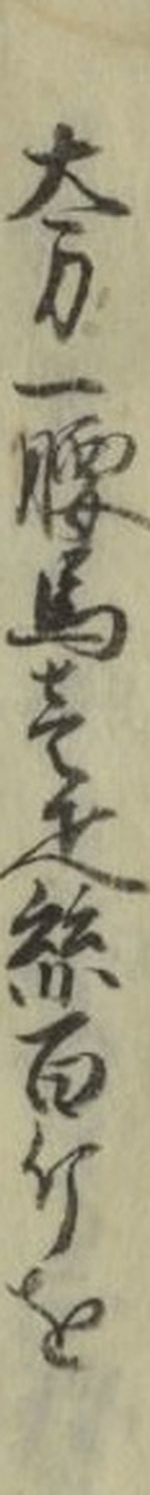太刀一腰馬一疋糸百斤を
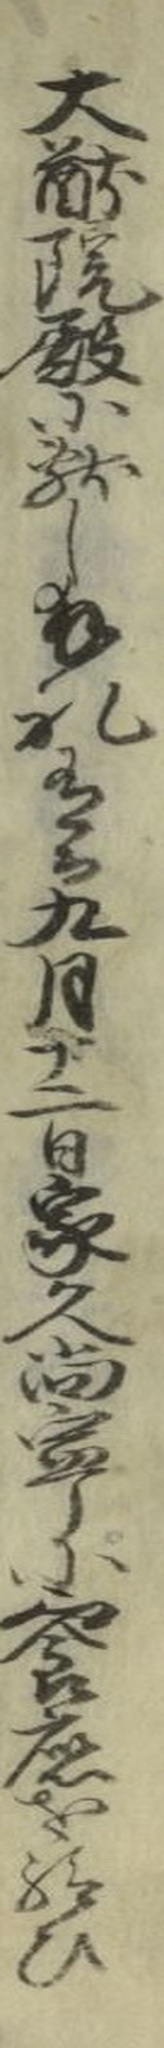大猷院殿に献し拝礼有て九月十二日家久尚寧に饗応を給ひ
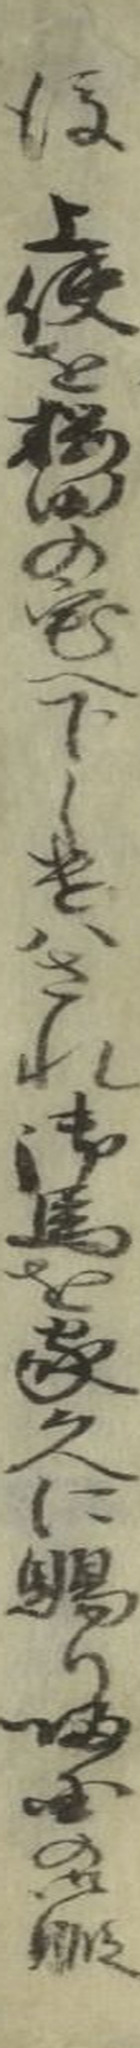後上使を桜田の宅へ下し遣はされ御馬を家久に賜り帰国の御暇
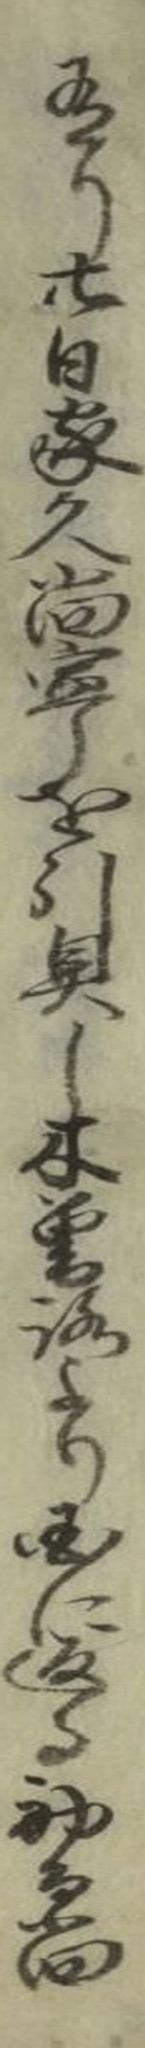有り廿日家久尚寧を引具し木曽路より国に帰る初て尚
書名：琉球人来朝之記
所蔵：University of the Ryukyus Library
